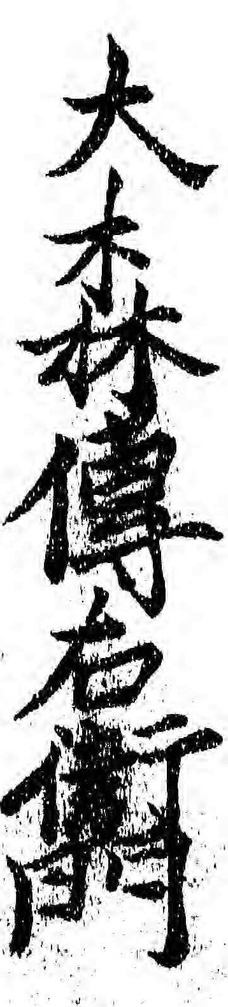大森傳右衛門
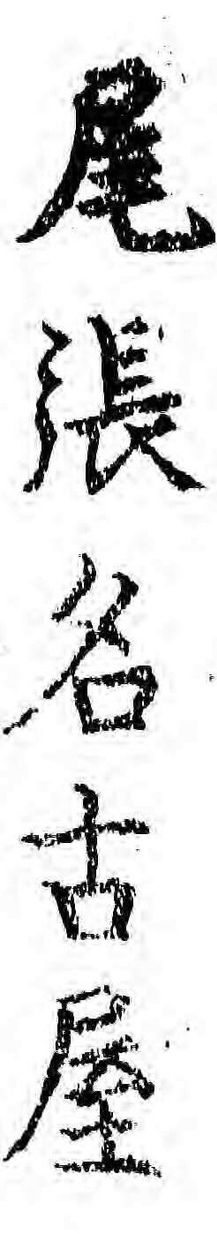尾張名古屋
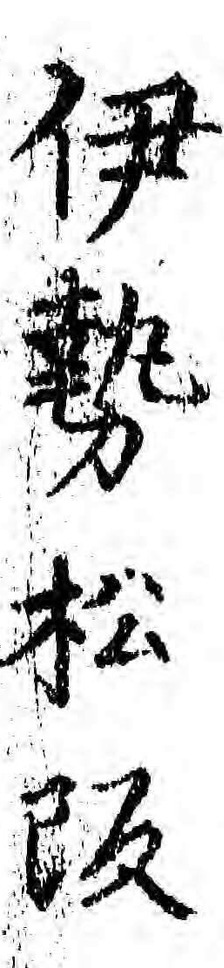伊勢松阪
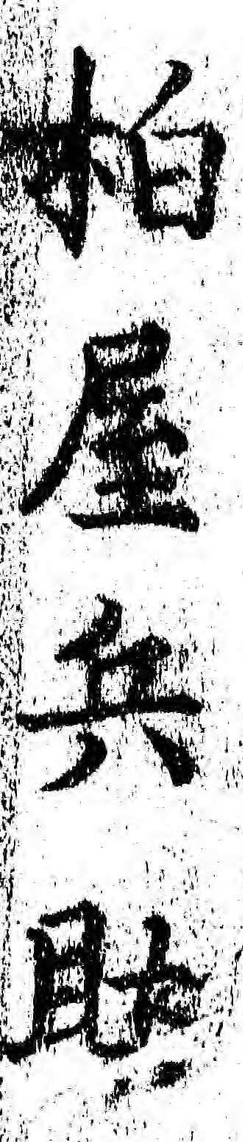柏屋兵助
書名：百人一首／小倉の山ふみ
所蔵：国文学研究資料館
